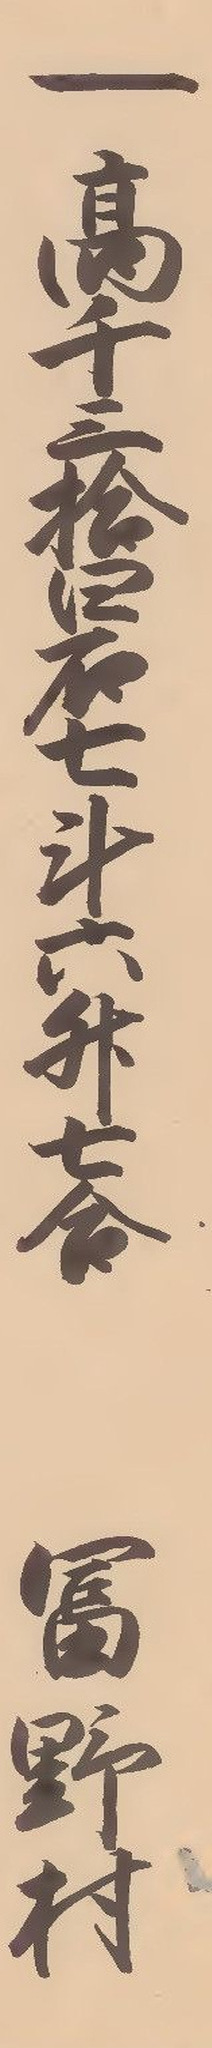一髙千三拾四石七斗六升七合冨野村
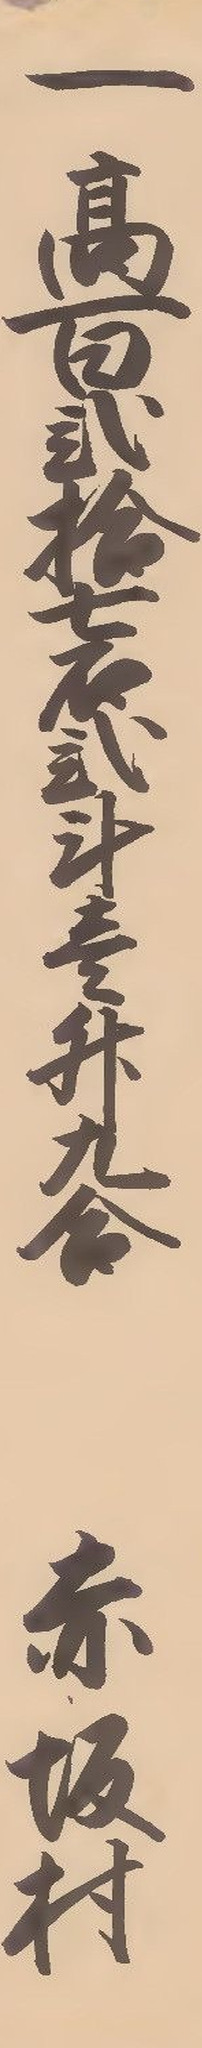一髙百弐拾七石弐斗壱升九合赤坂村
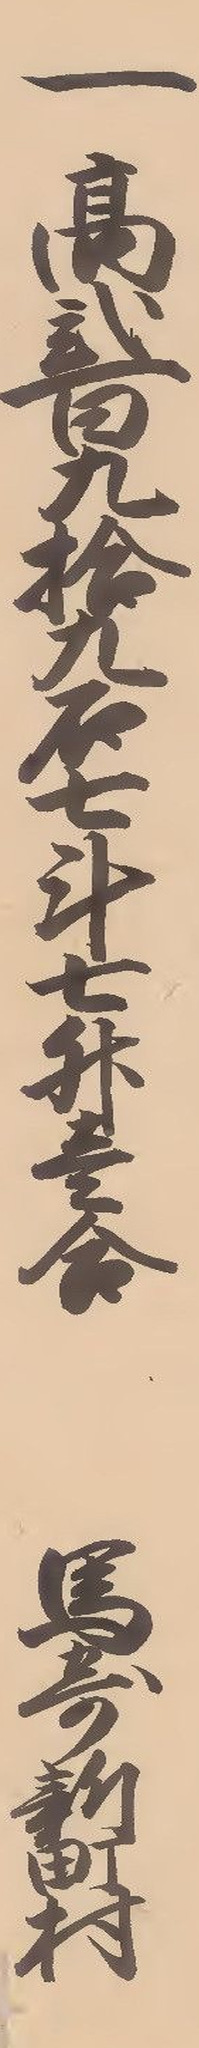一髙弐百九拾九石七斗七升壱合馬寄新町村
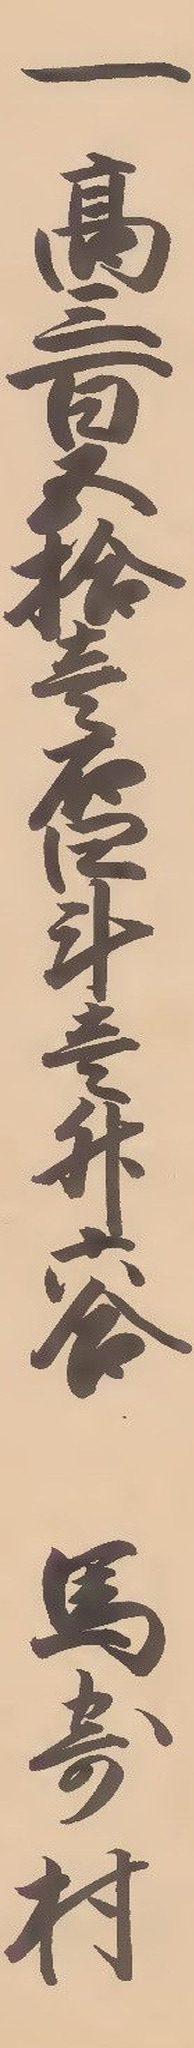一髙三百五拾壱石四斗壱升六合馬寄村
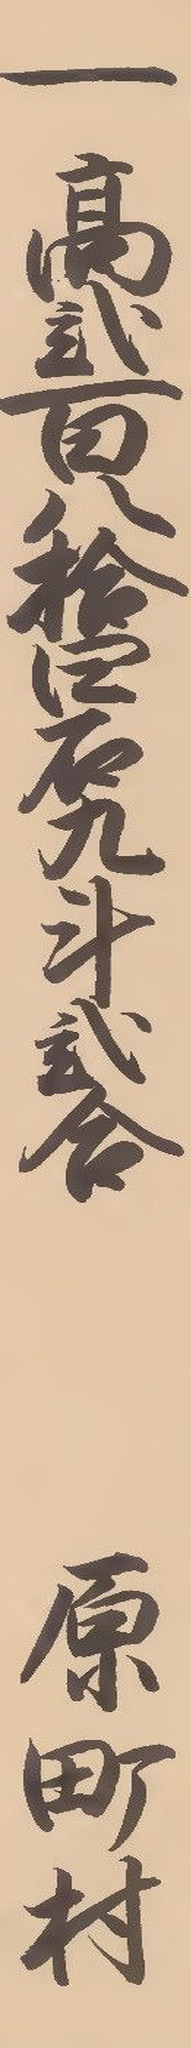一髙弐百八拾四石九斗弐合原町村
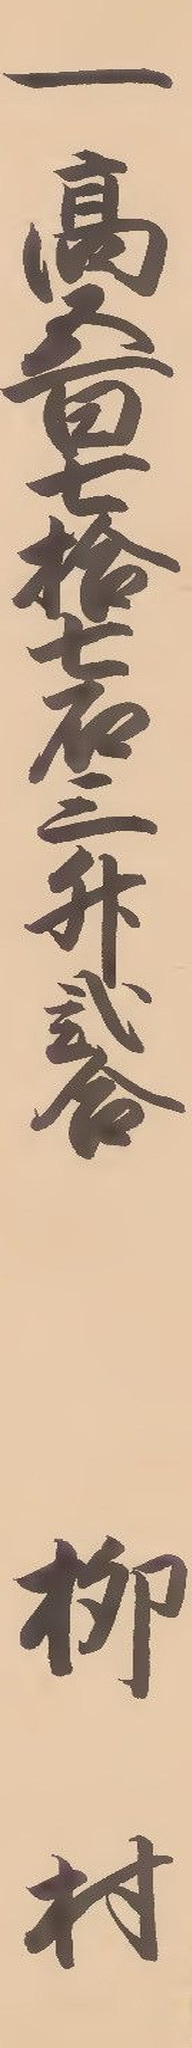一髙五百七拾七石三升弐合柳村
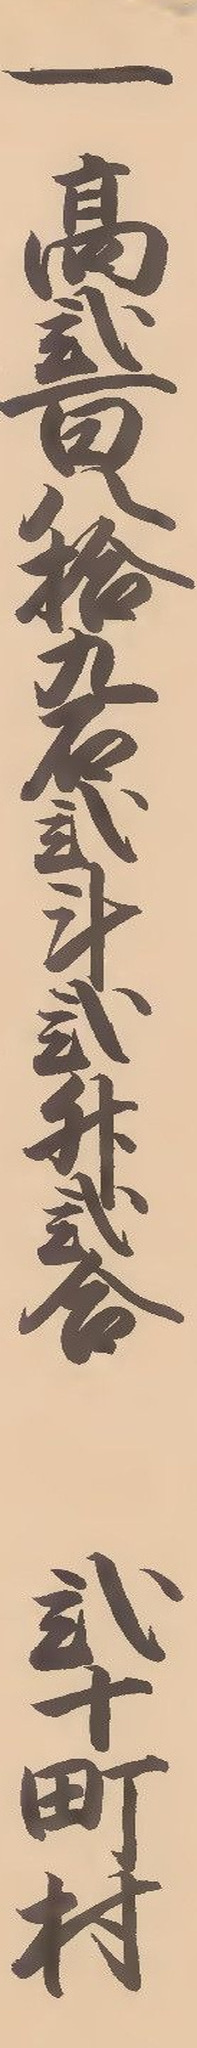一髙弐百八拾九石弐斗弐升弐合弐十町村
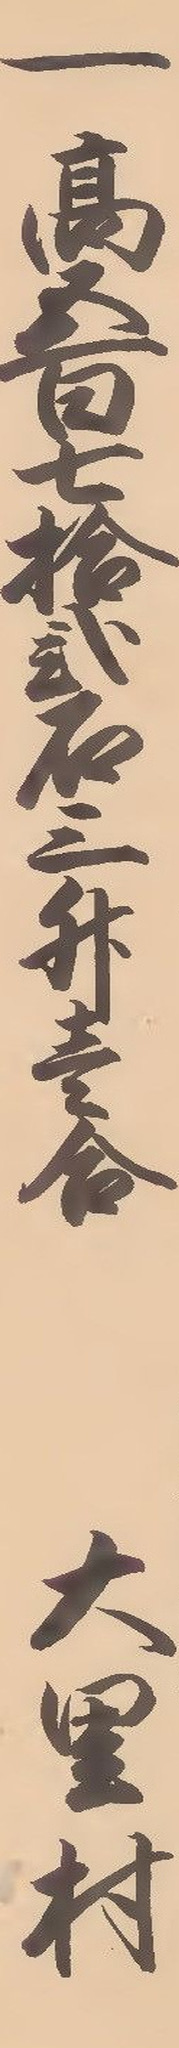一髙五百七拾弐石三升壱合大里村

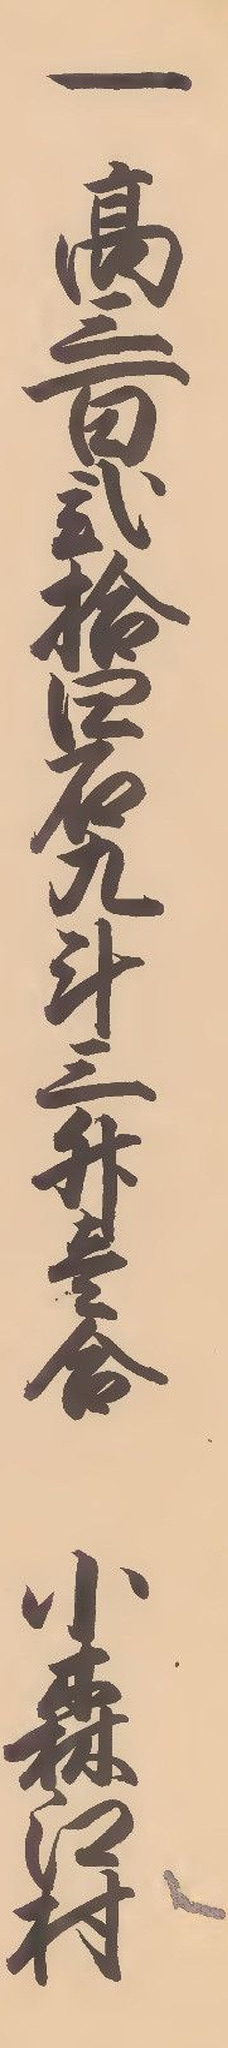一髙三百弐拾四石九斗三升壱合小森江村
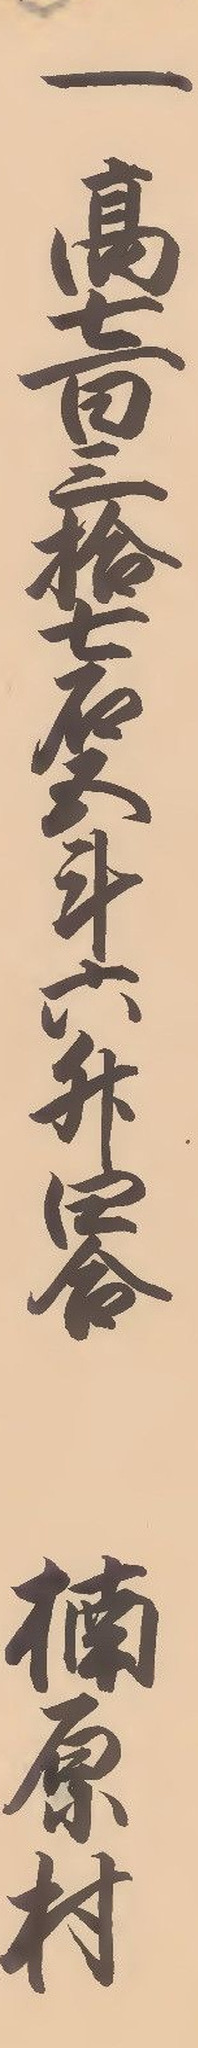一髙七百三拾七石五斗六升四合楠原村
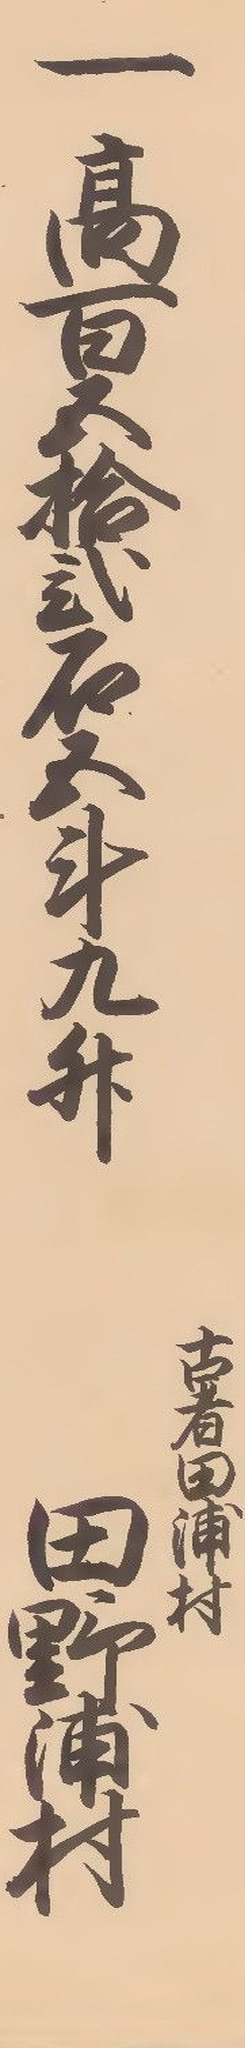一髙百五拾弐石五斗九升田野浦村
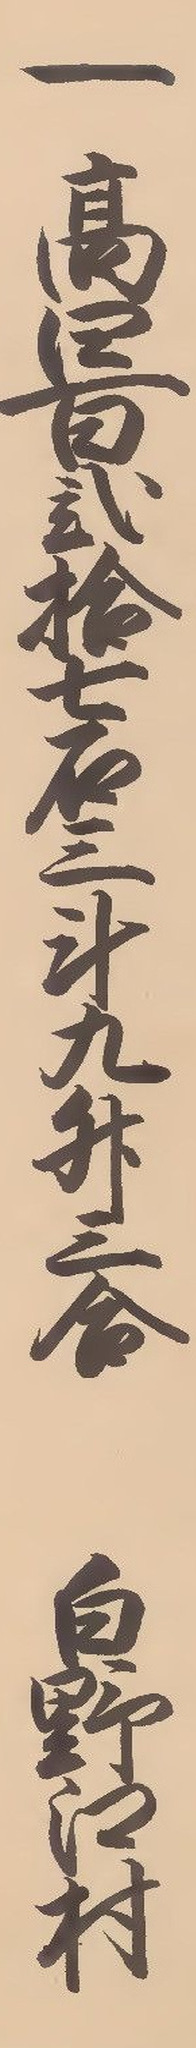一髙四百弐拾七石三斗九升三合白野江村
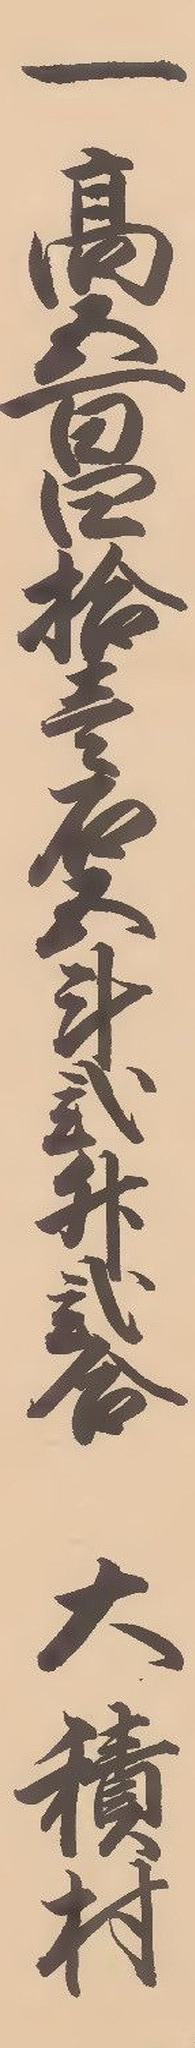一髙五百四拾壱石五斗弐升弐合大積村
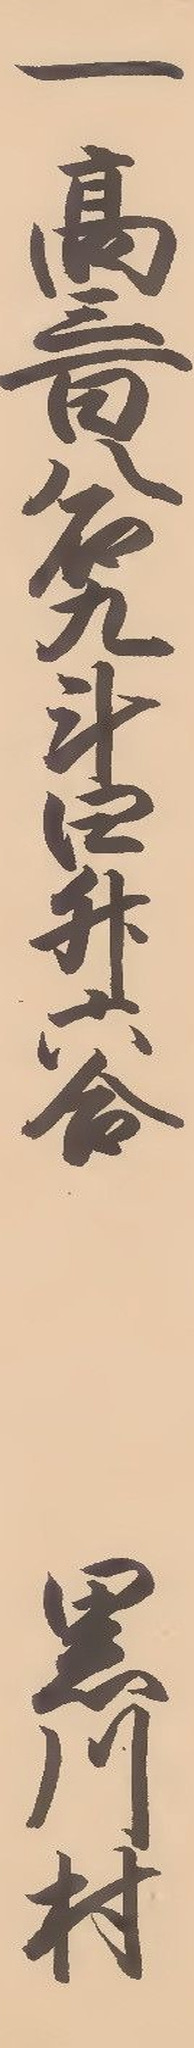一髙三百八石九斗四升六合黑川村
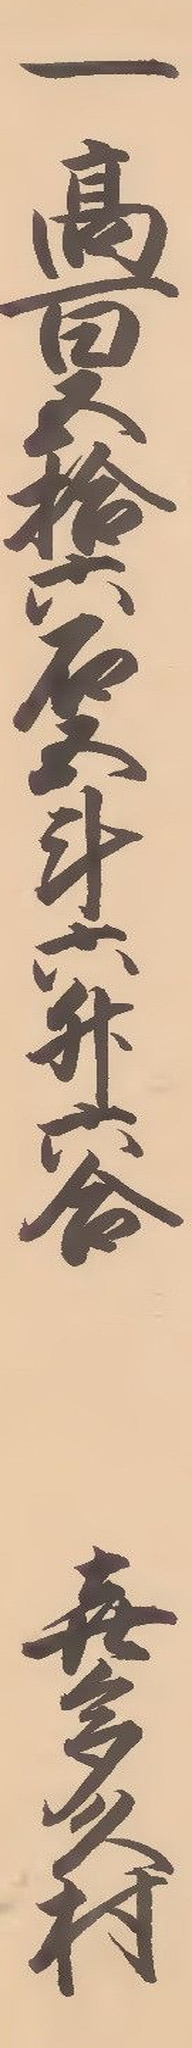一髙百五拾六石五斗六升六合喜多久村

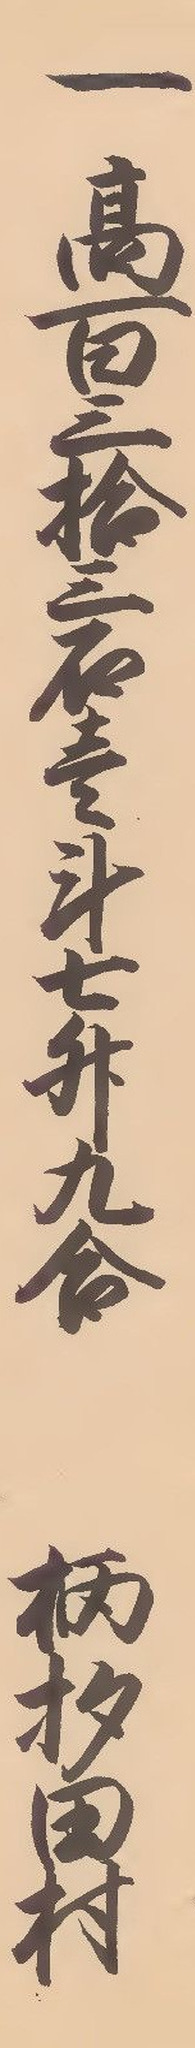一髙百三拾三石壱斗七升九合柄杓田村
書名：豊前国郷帳
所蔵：国立公文書館 National Archives of Japan
